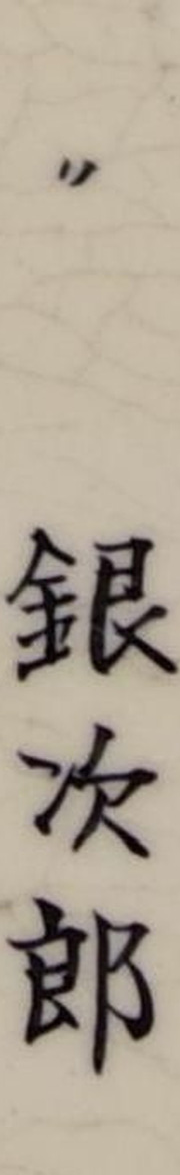銀次郎
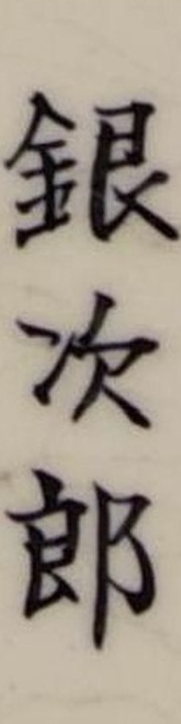銀次郎
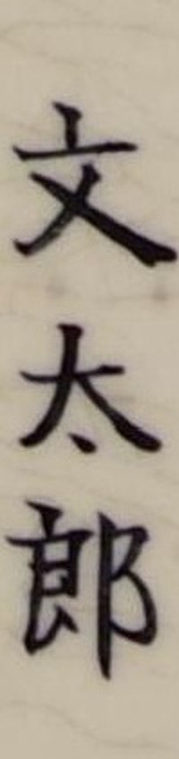文太郎
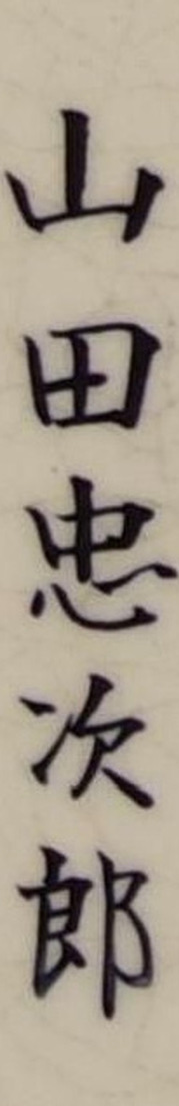山田忠次郎

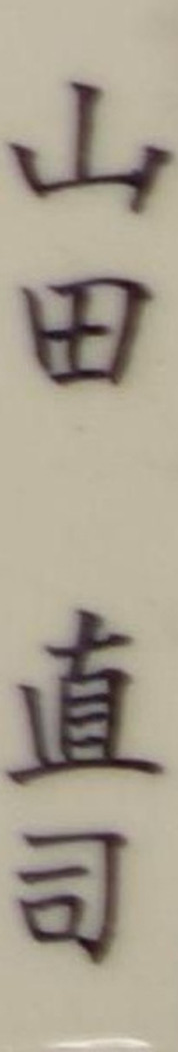山田直司
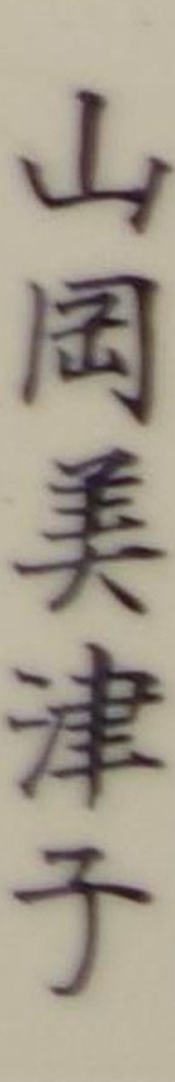山岡美津子
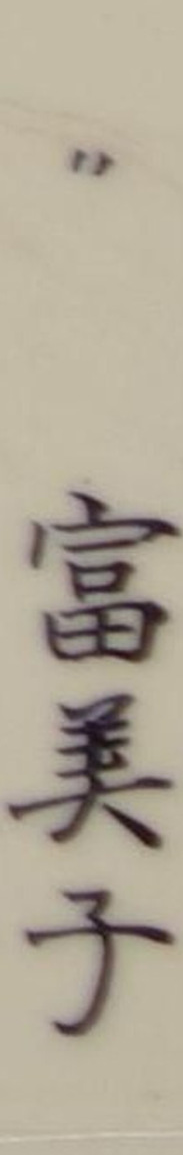富美子
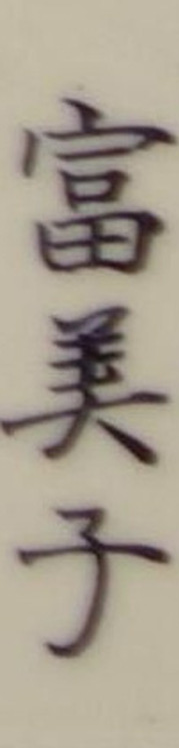富美子
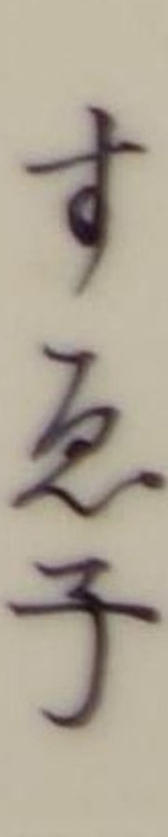すえ子
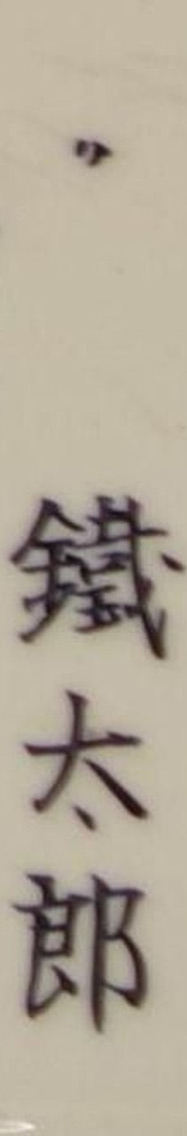鐵太郎
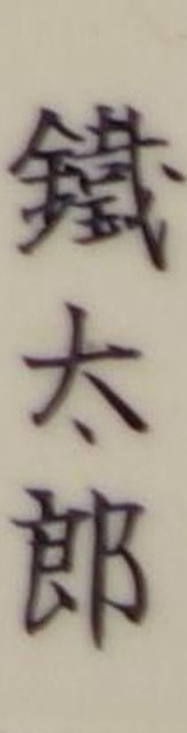鐵太郎
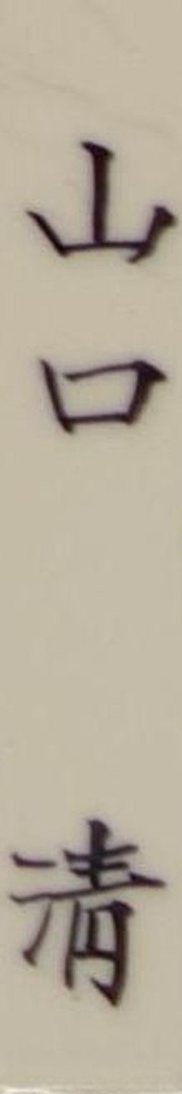山口清
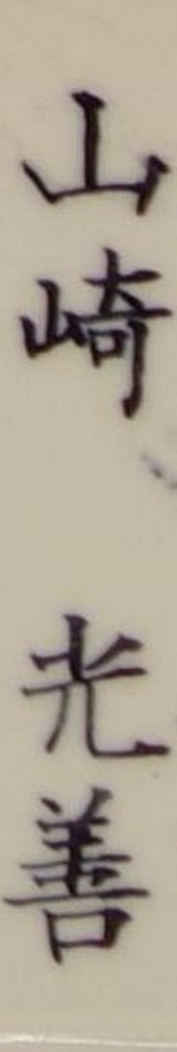山崎光善
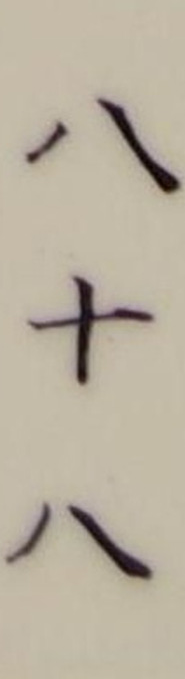八十八
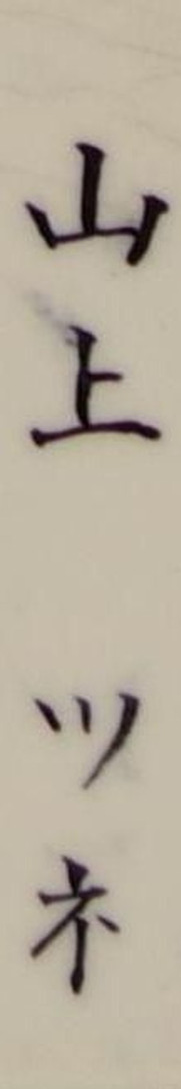山上ツネ
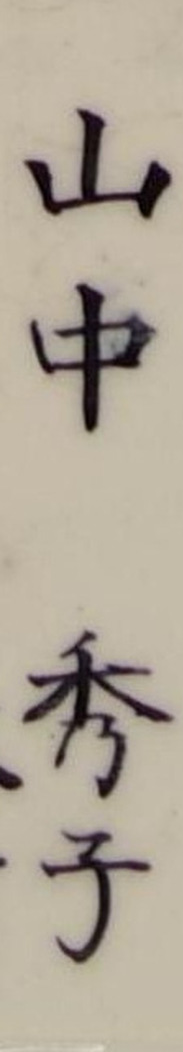山中秀子
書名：M~S
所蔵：高野山金剛峯寺
